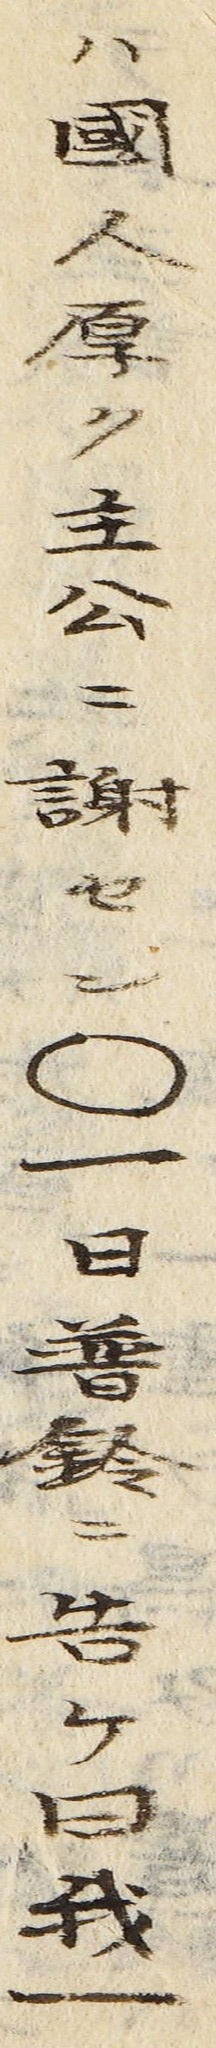ハ国人厚ク主公ニ謝セン◯一日普鈴ニ告ケ曰我一
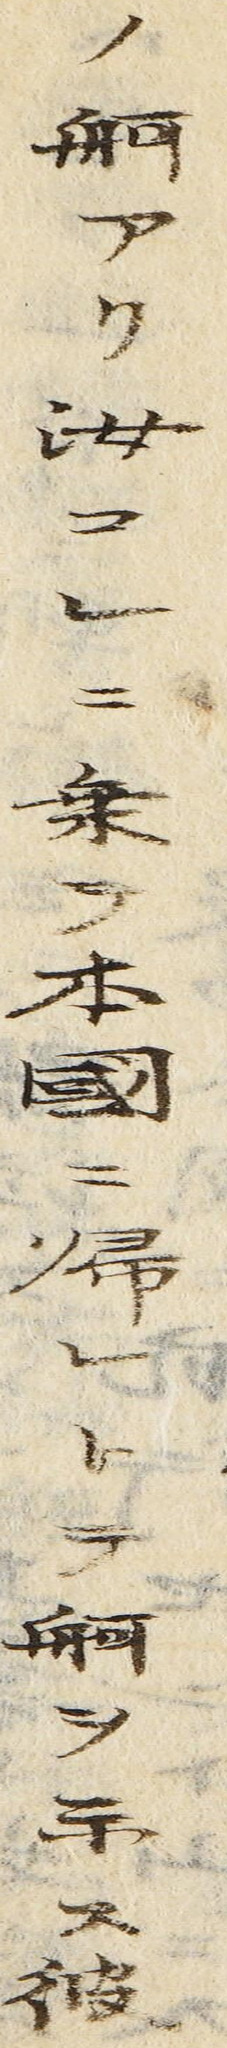ノ舸アリ汝コレニ乗テ本国ニ帰レトテ舸ヲ示ス彼
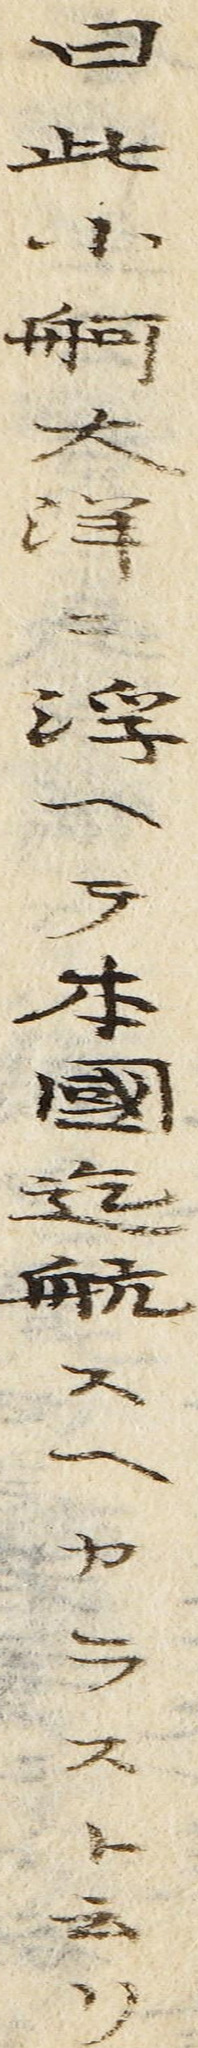曰此小舸大洋ニ浮ヘテ本国迄航スヘカラスト云リ
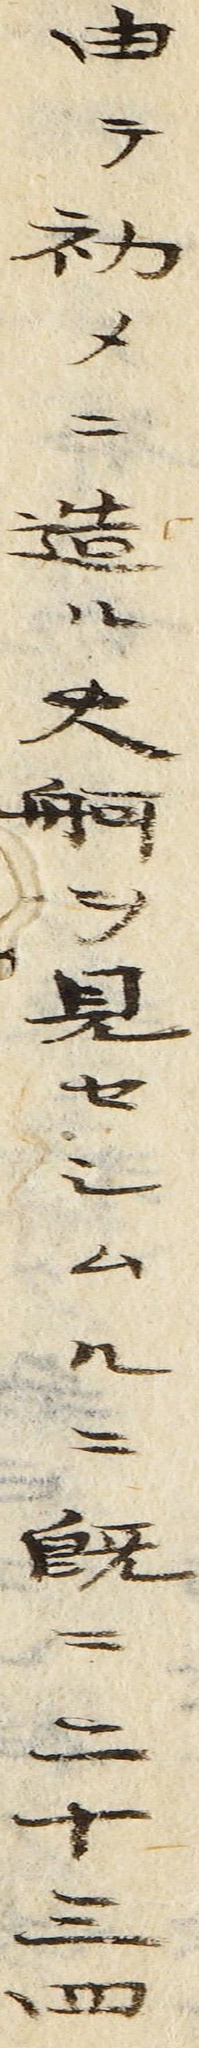由テ初メニ造ル大舸ヲ見セシムルニ既ニ二十三四
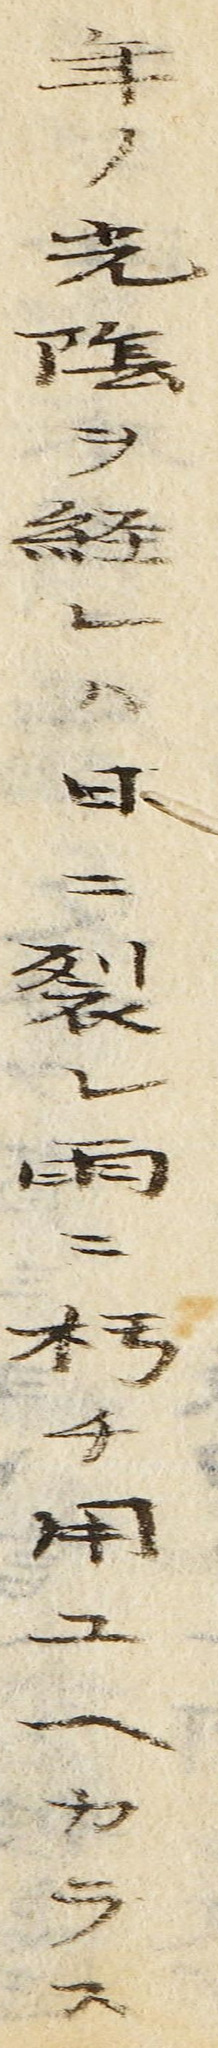年ノ光陰ヲ経レハ日ニ裂レ雨ニ朽チ用ユヘカラス
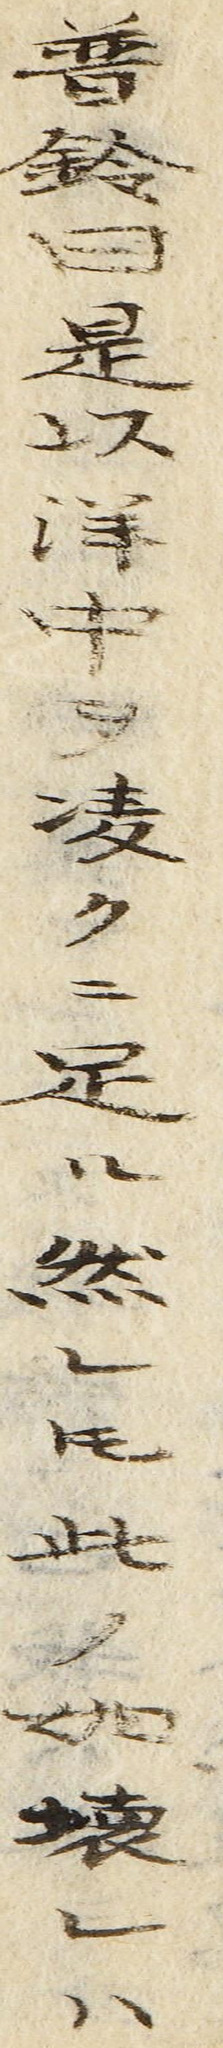普鈴曰是以洋中ヲ凌クニ足ル然レトモ此ノ如壊レハ
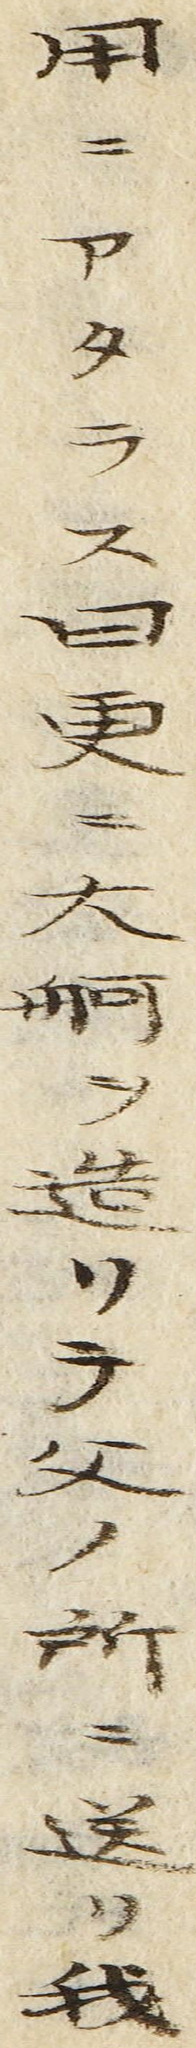用ニアタラス曰更ニ大舸ヲ造リテ父ノ所ニ送リ我
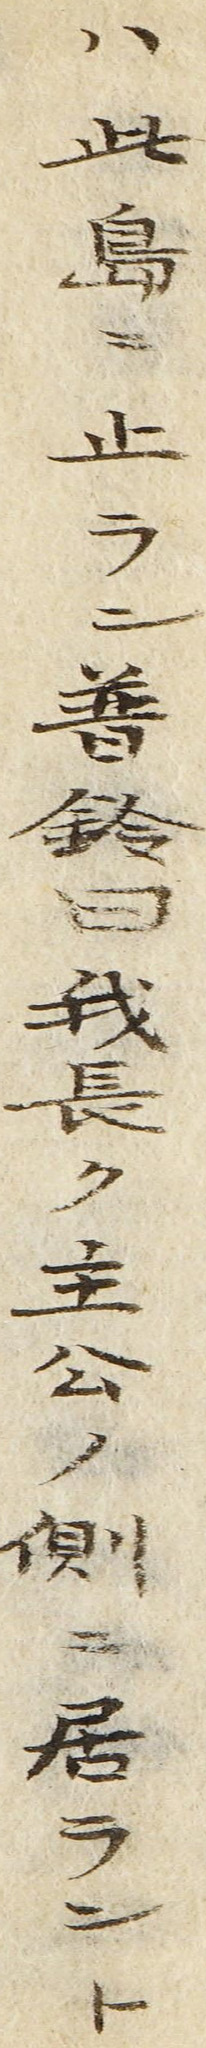ハ此島ニ止ラン普鈴曰我長ク主公ノ側ニ居ラント
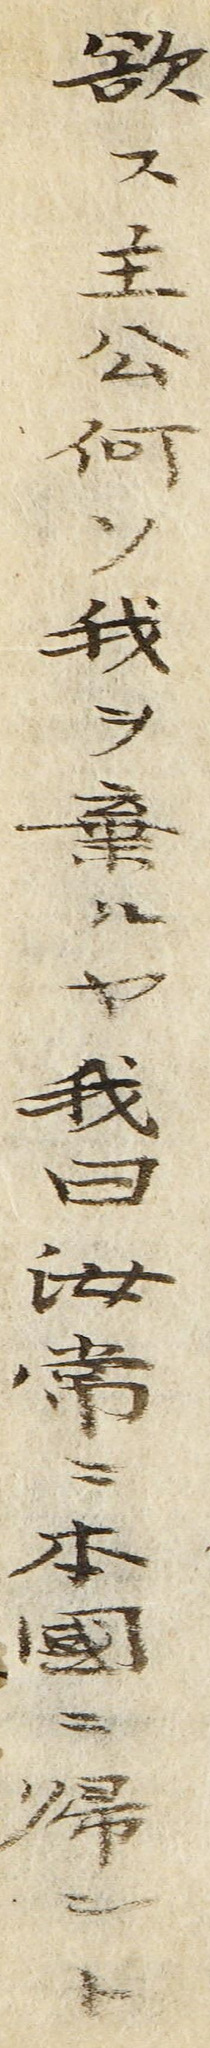欲ス主公何ソ我ヲ棄ルヤ我曰汝常ニ本国ニ帰ント

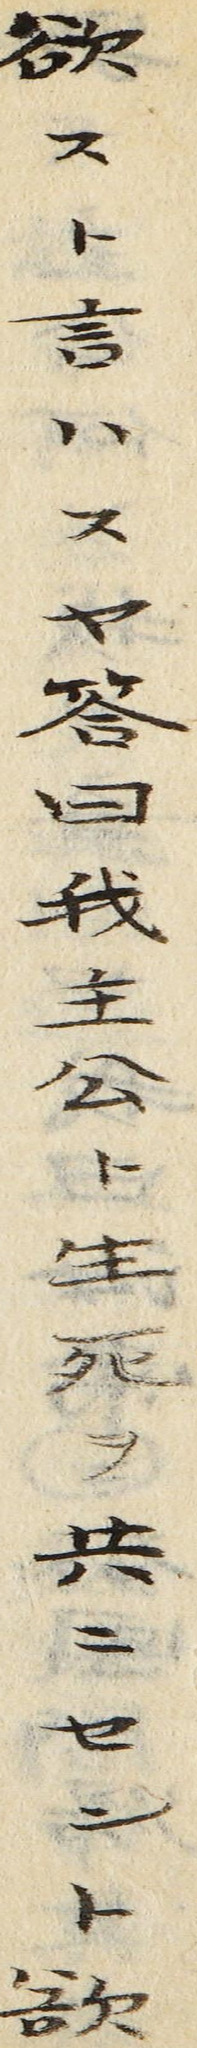欲スト言ハスヤ答曰我主公ト生死ヲ共ニセント欲
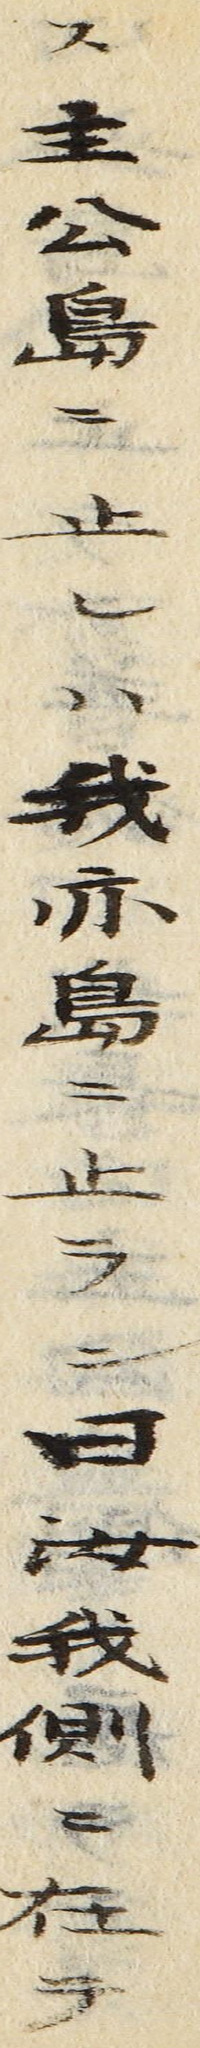ス主公島ニ止レハ我亦島ニ止ラン曰汝我側ニ在テ
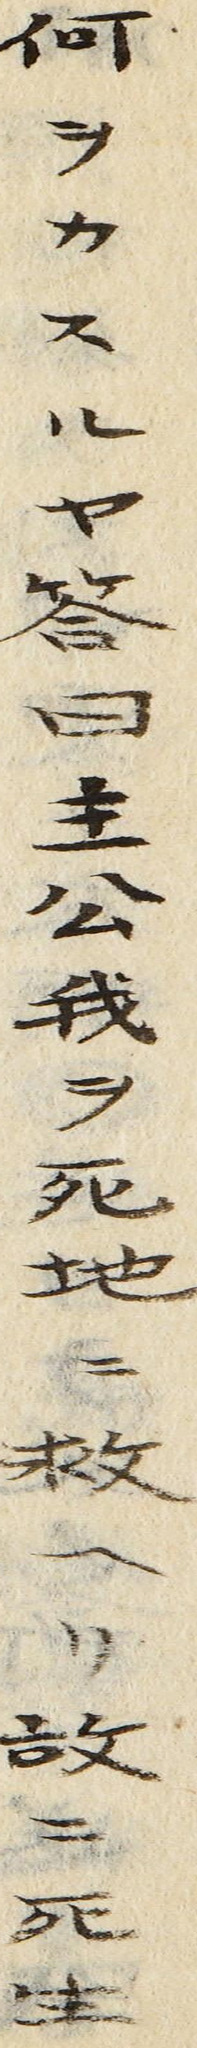何ヲカセルヤ答曰主公我ヲ死地ニ救ヘリ故ニ死生
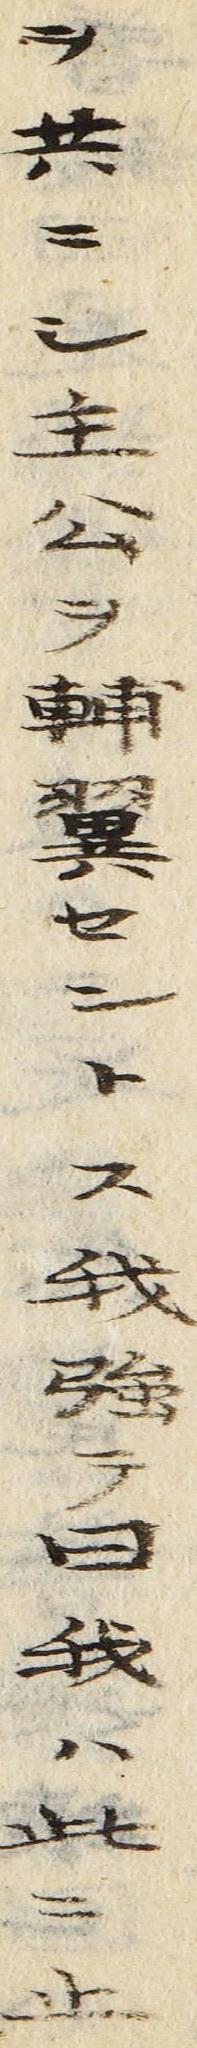ヲ共ニシ主公ヲ輔翼セントス我強テ曰我ハ此ニ止
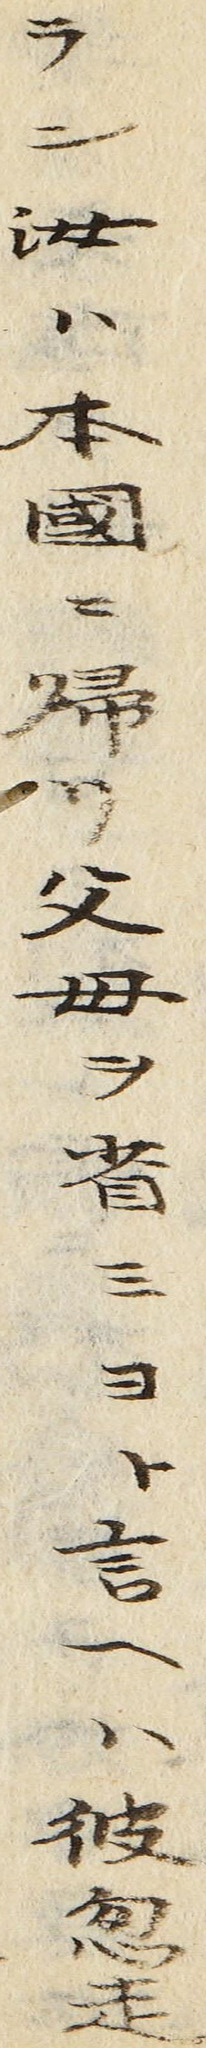ラン汝ハ本国ニ帰リ父母ヲ省ミヨト言ヘハ彼忽走
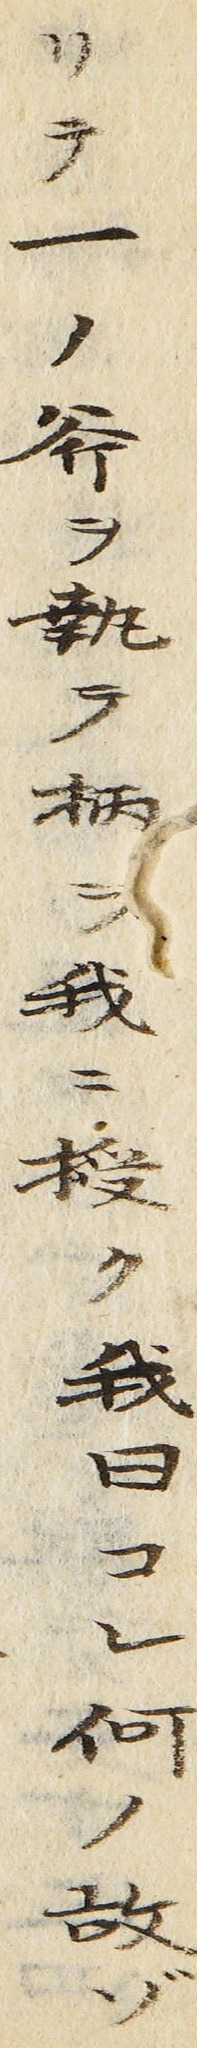リテ一ノ斧ヲ執テ柄ヲ我ニ授ク我曰コレ何ノ故ゾ
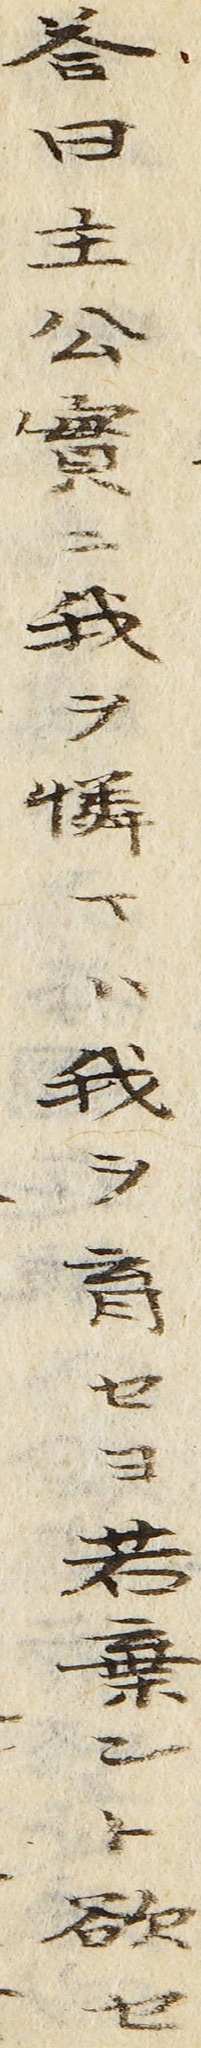答曰主公実ニ我ヲ憐マハ我ヲ育セヨ若棄ント欲セ
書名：漂流紀事
